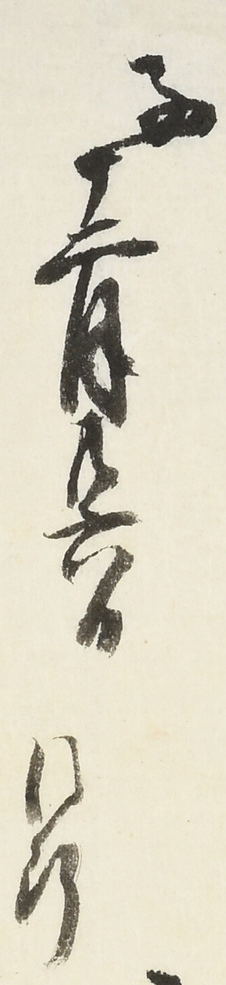十二月廿六日同断
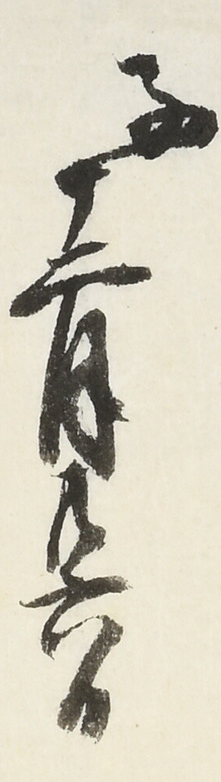十二月廿六日同断
